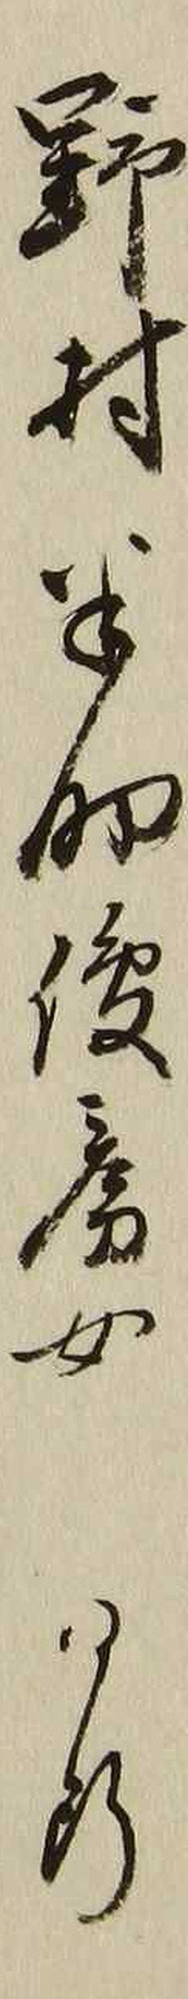野村半助俊房女同断
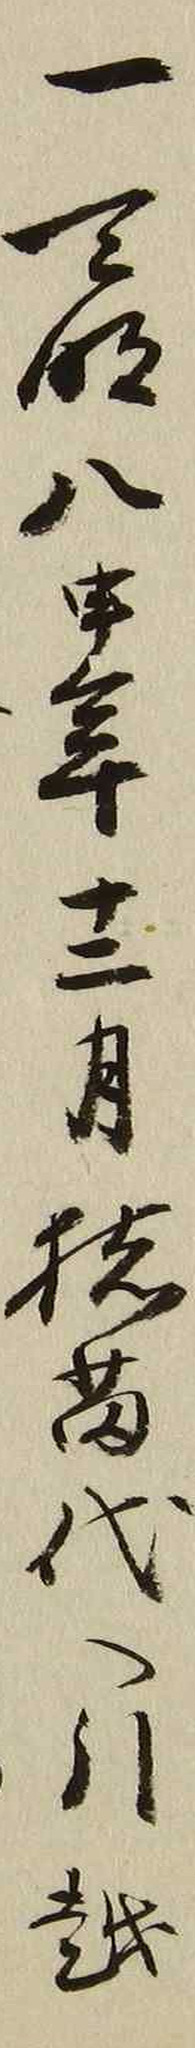一天明八申年十二月猪苗代へ引越
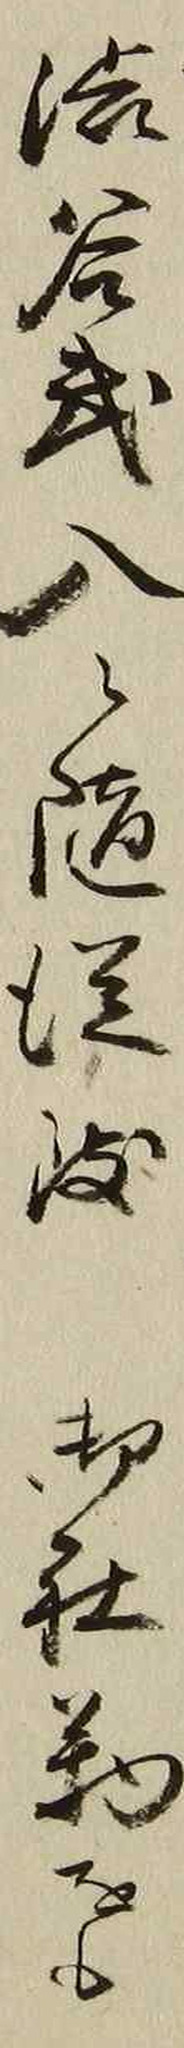渋谷武八ニ随従致御社勤をも
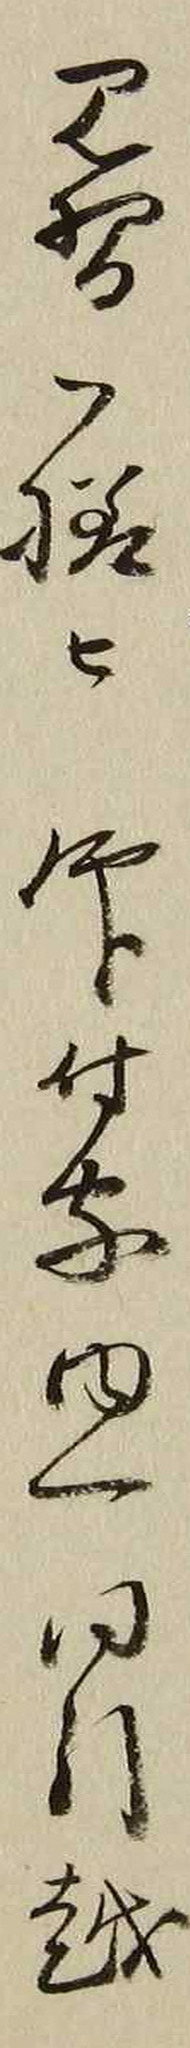見習候様被仰付家内一同引越
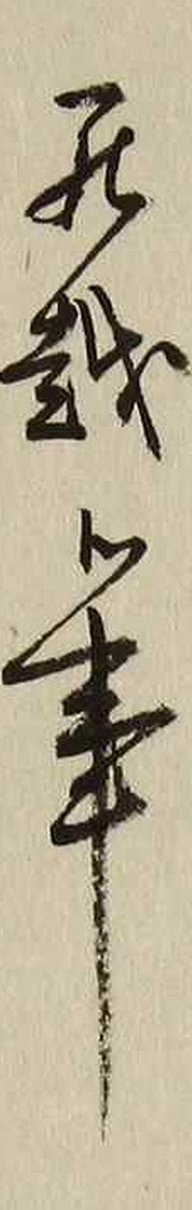罷越候事
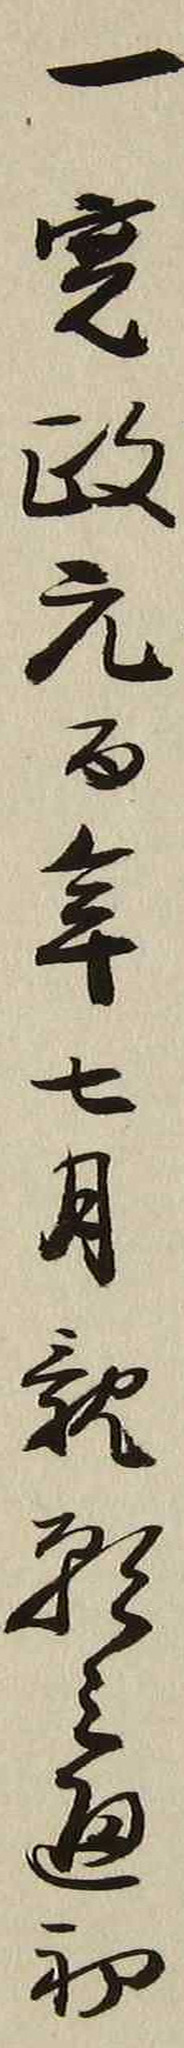一寛政元酉年七月親願之通初
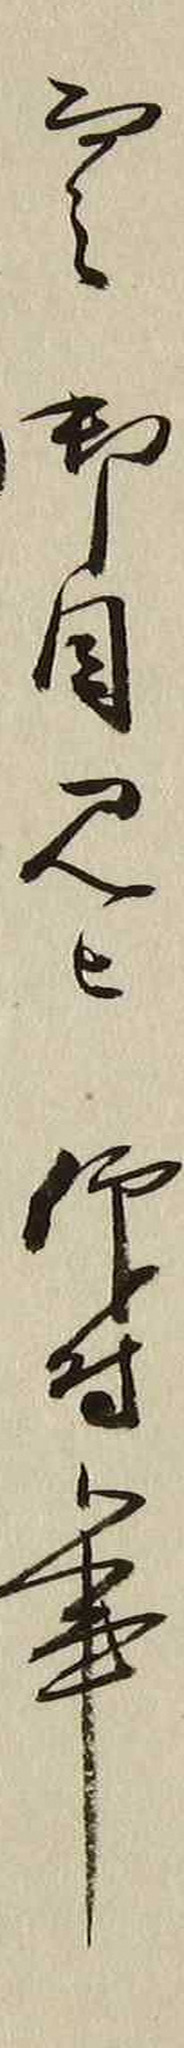而之御目見被仰付候事
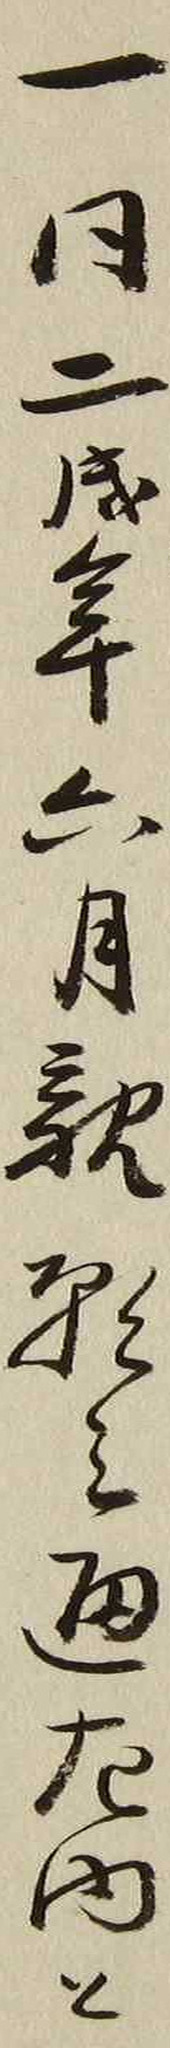一同二戌年六月親願之通左内と
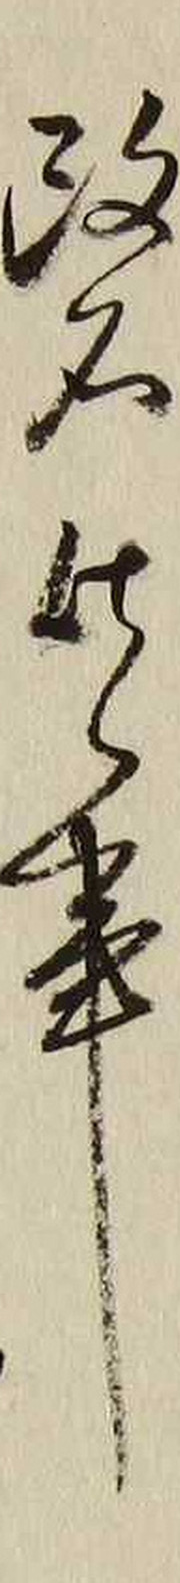改名仕候事
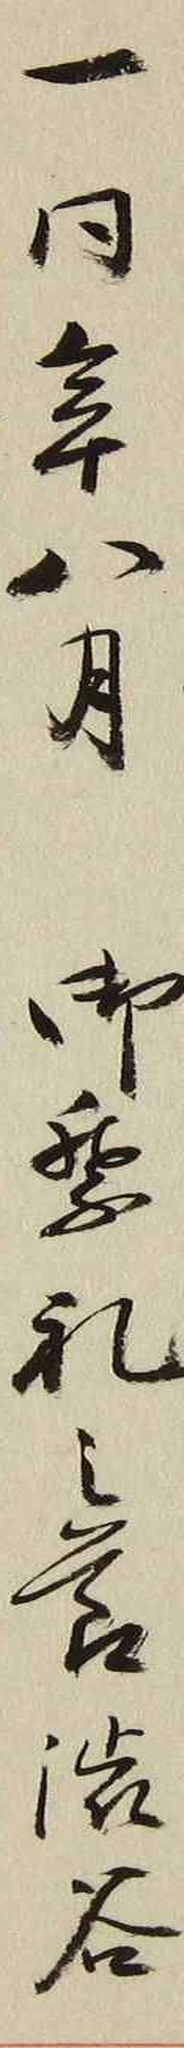一同年八月御祭礼之節渋谷
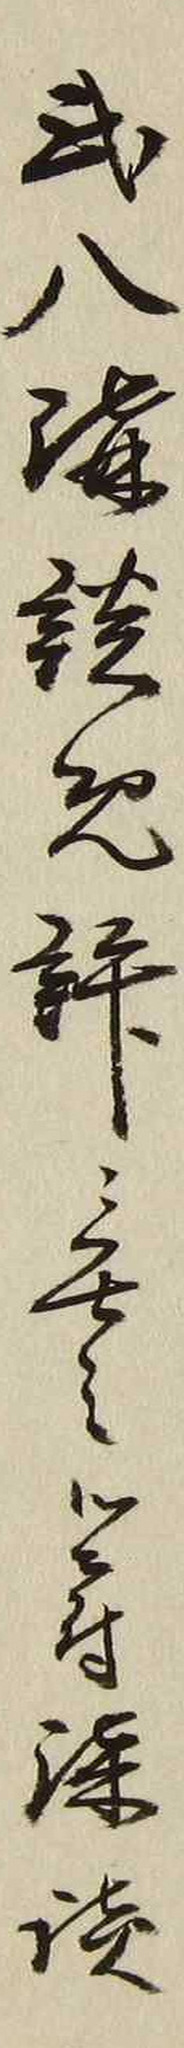武八講談免許ニ無之候ニ付講談
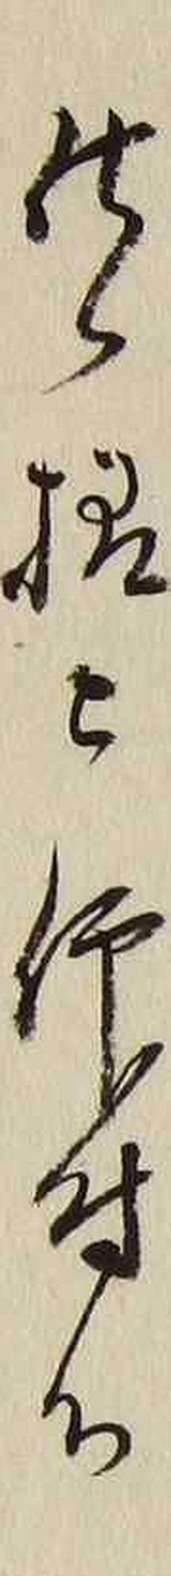仕候様被仰付候
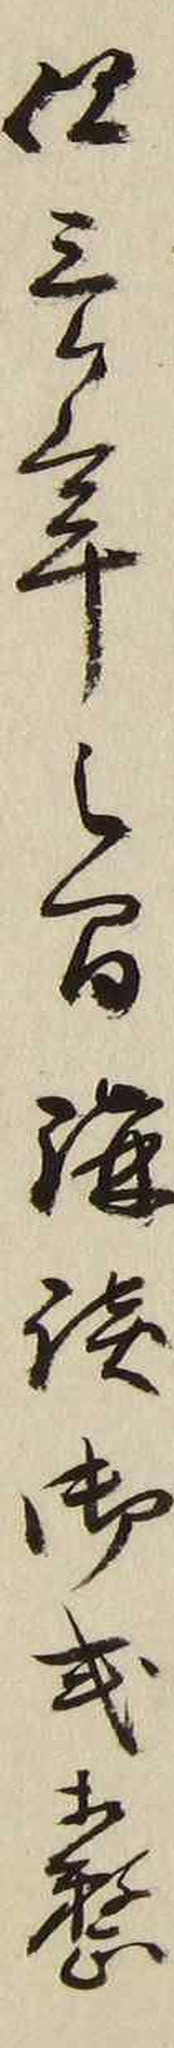但三ヶ年之間講談御式相整

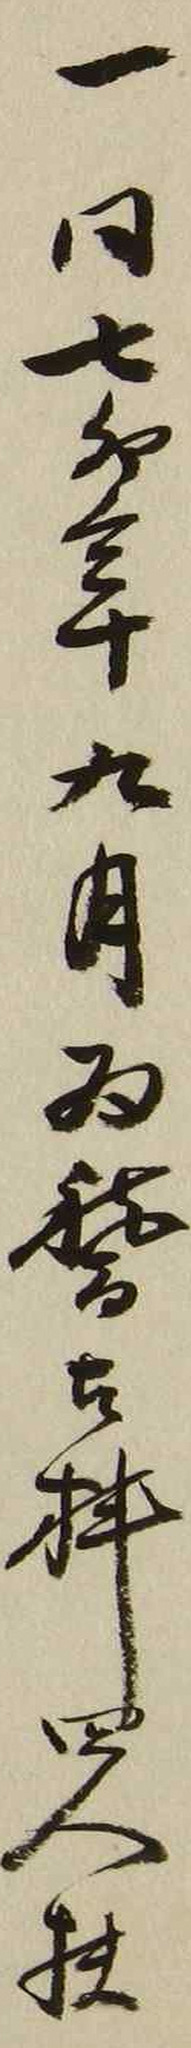一同七卯年九月為稽古料四人扶
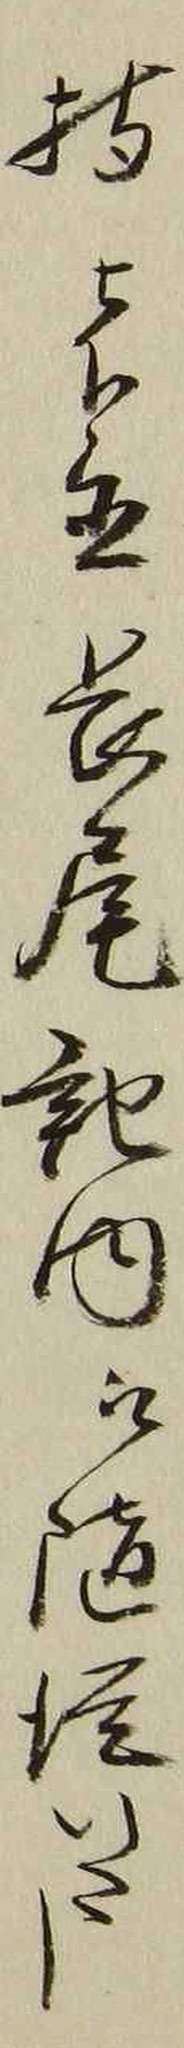持被下置長尾記内江随従いたし
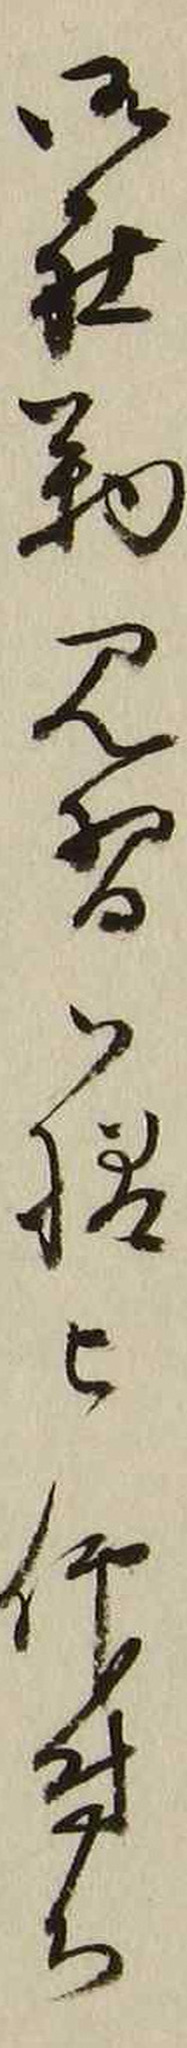御社勤見習候様被仰付候
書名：諸士系譜　巻之291　さ之部23
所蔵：会津若松市立会津図書館
